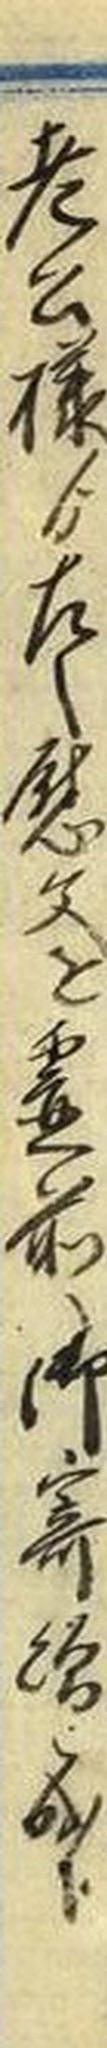老公様ゟ左之慰文を霊前へ御寄贈被成候
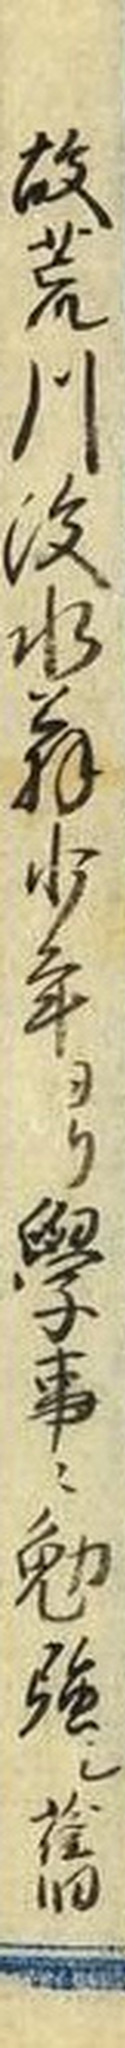故荒川汶水翁少年より学事に勉強し舊
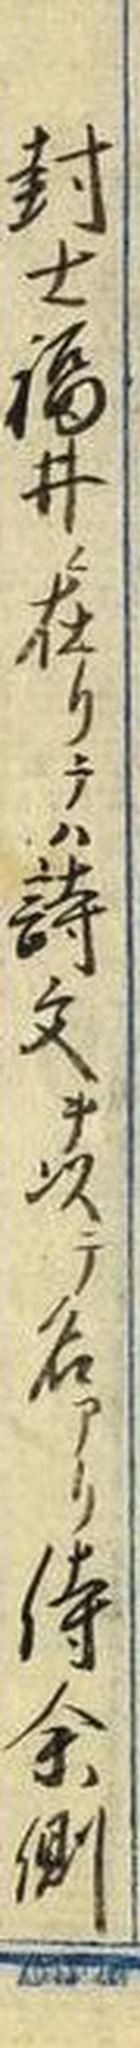封士福井に在りては詩文を以て名あり侍余側
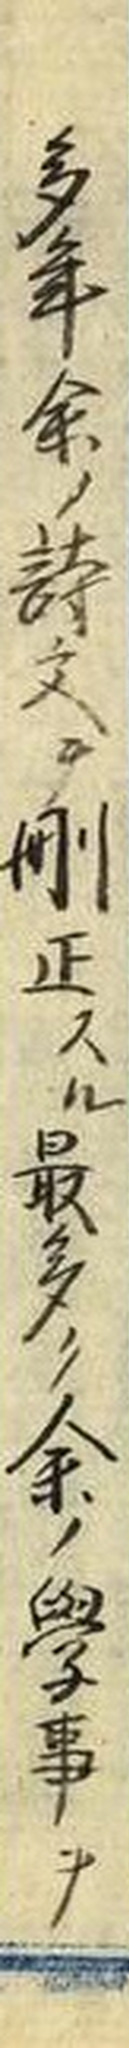多年余の詩文を刪正する最多く余の学事を
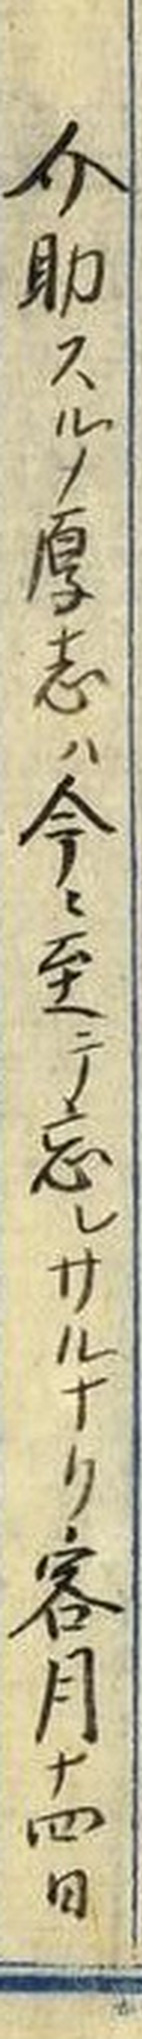介助するの厚志は今に至て忘れさるなり客月十四日
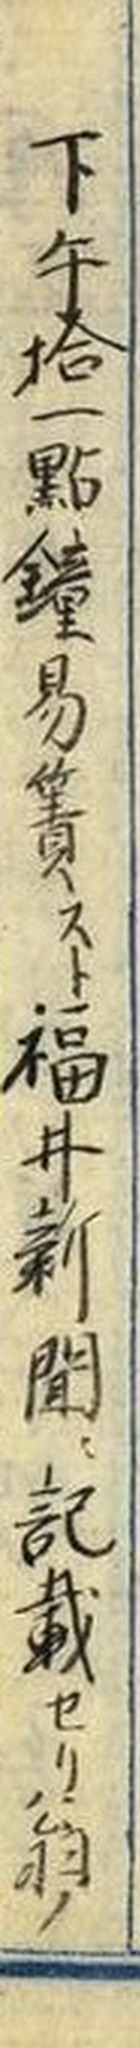下午拾一點鐘易簀すと福井新聞に記載せり翁の

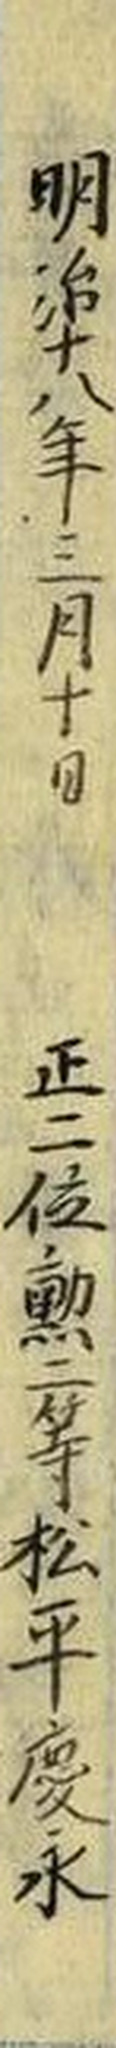明治十八年三月十日正二位勲二等松平慶永
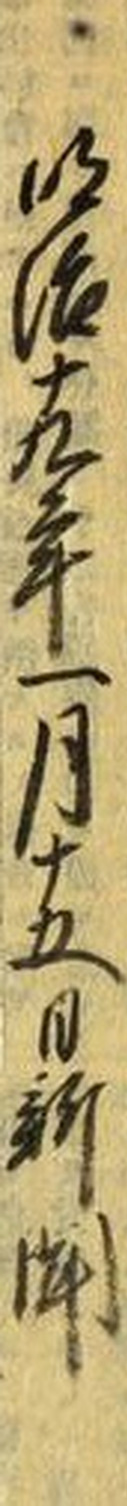明治十九年一月十五日新聞」
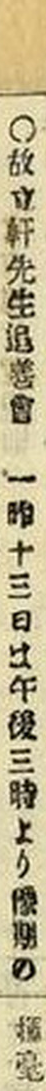○故立軒先生追善會一昨十三日は午後三時より豫期の
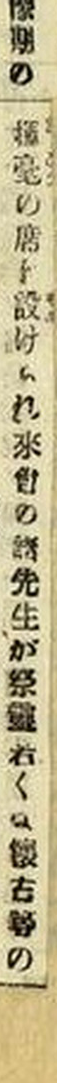揮毫の席も設けられ來會の諸先生が祭靈若くは懐古等の
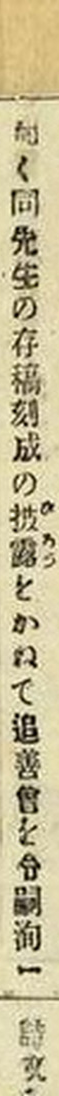如く同先生の存稿刻成の披露をかねて追善會を令嗣洵一
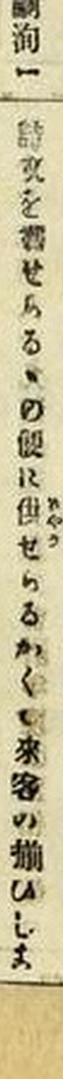詩文を書せらるゝの便に供せらるかくて來客の揃ひしこ
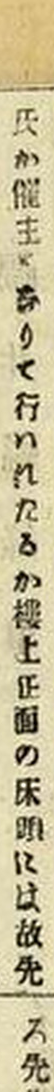氏か催主となりて行はれたるか樓上正面の床頭には故先
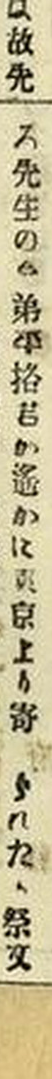ろ先生の舎弟平格君か遙かに東京より寄られたる祭文
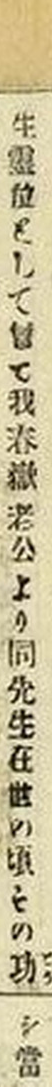生靈位として曾て我が春嶽老公より同先生在世の頃その功
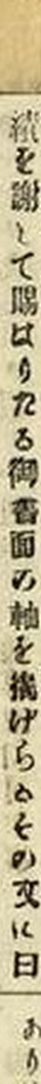績を謝して賜はりたる御書面の軸を掲げらるその文に曰
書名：温古集 四巻
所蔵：福井県文書館 Fukui Prefectural Archives
